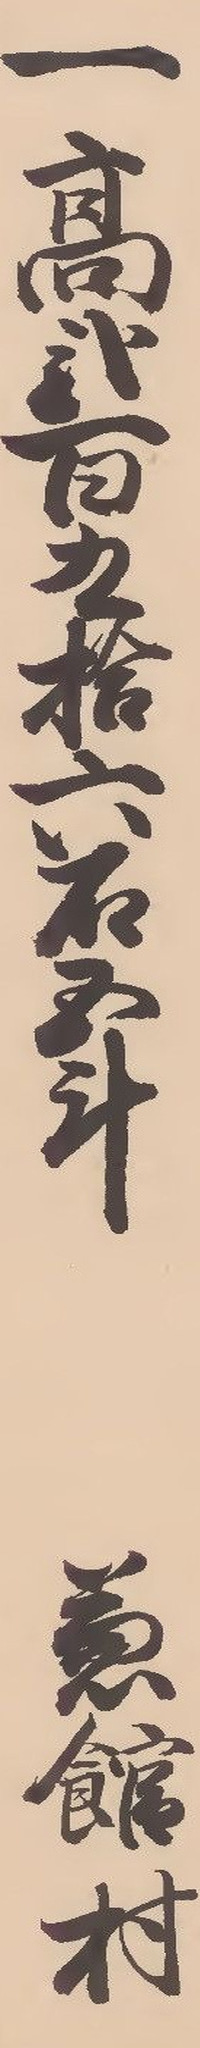一高弐百九拾六石五斗兼館村

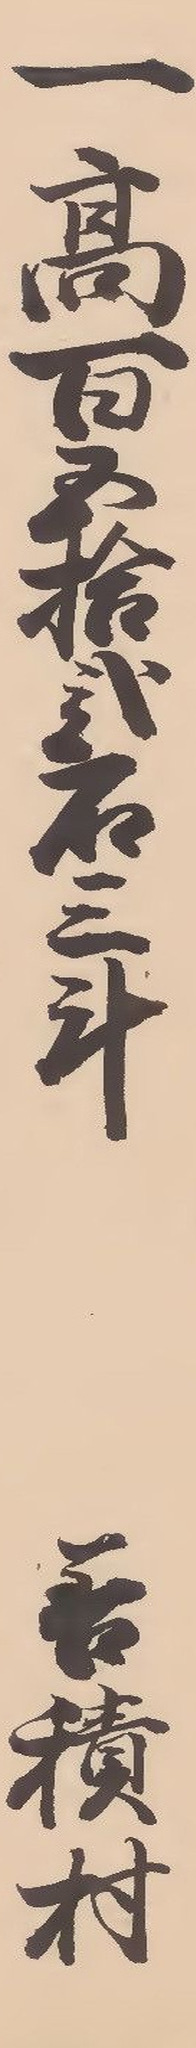一高百五拾弐石三斗善積村
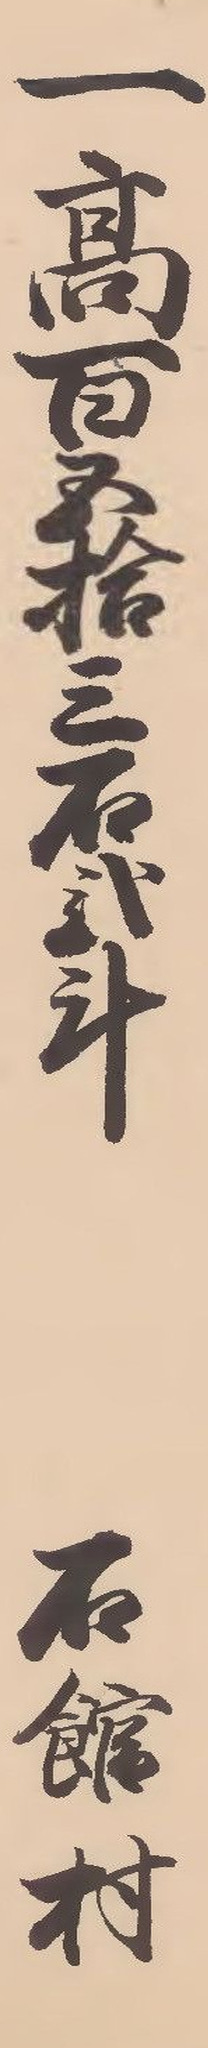一高百五拾三石弐斗石館村
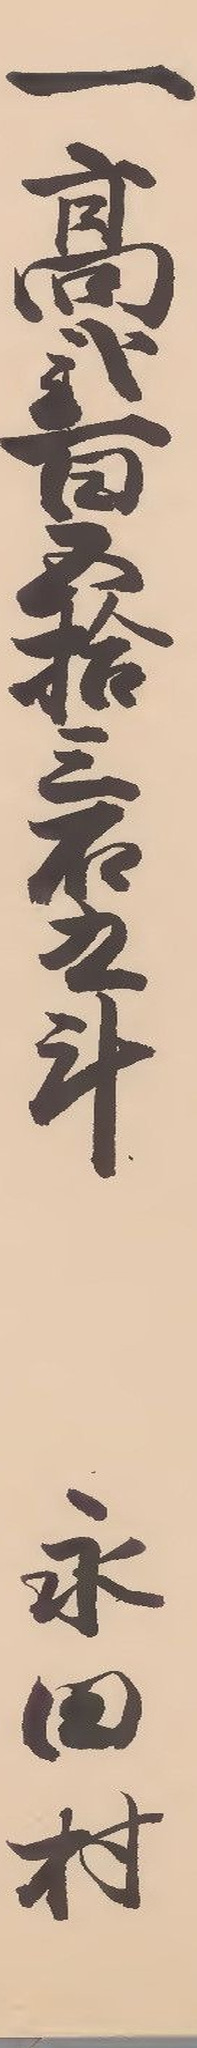一高弐百五拾三石九斗永田村
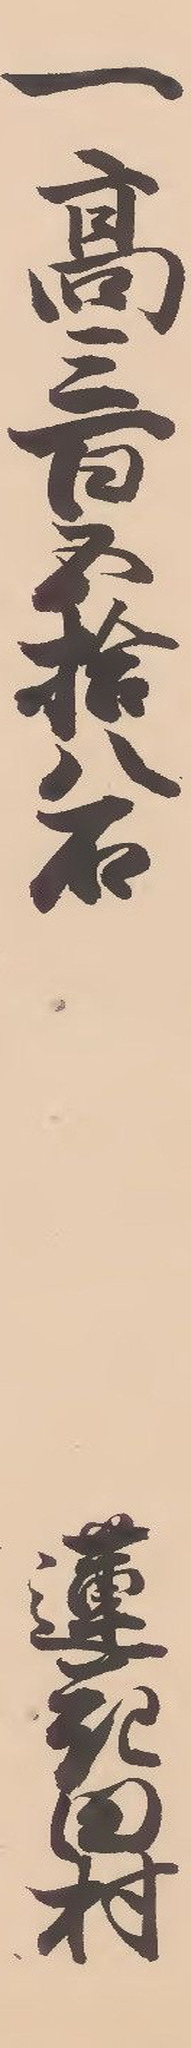一高三百五拾八石蓮花田村
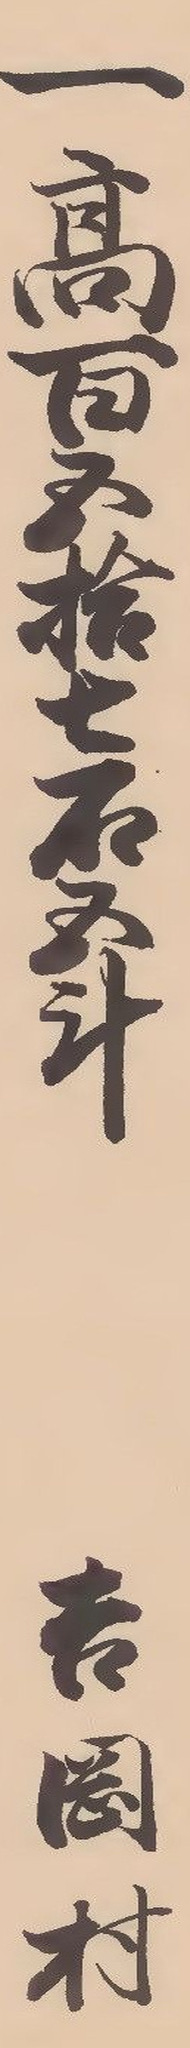一高百五拾七石五斗吉岡村
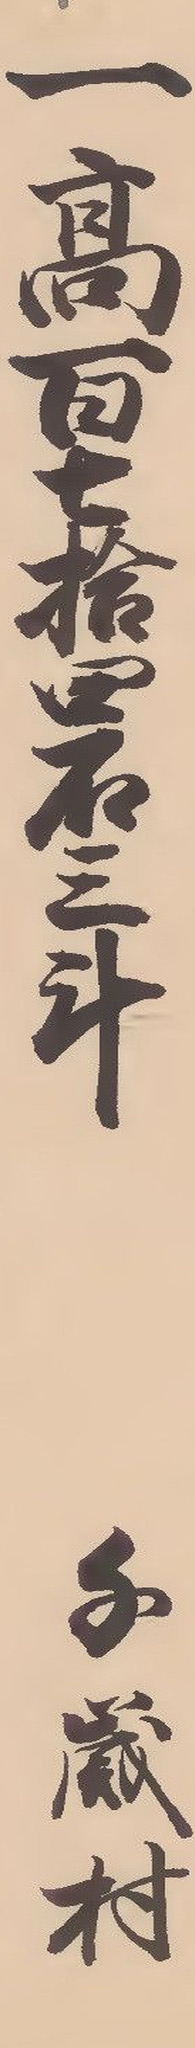一高百七拾四石三斗千歳村

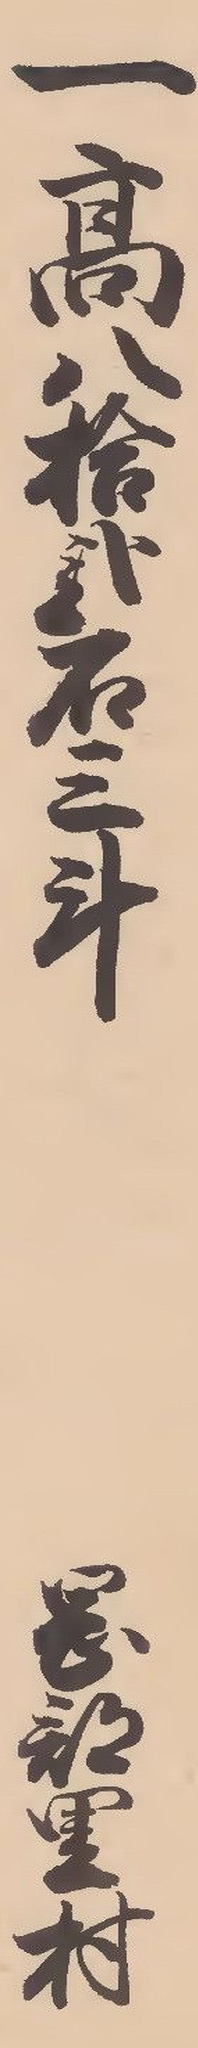一高八拾弐石三斗岡部里村
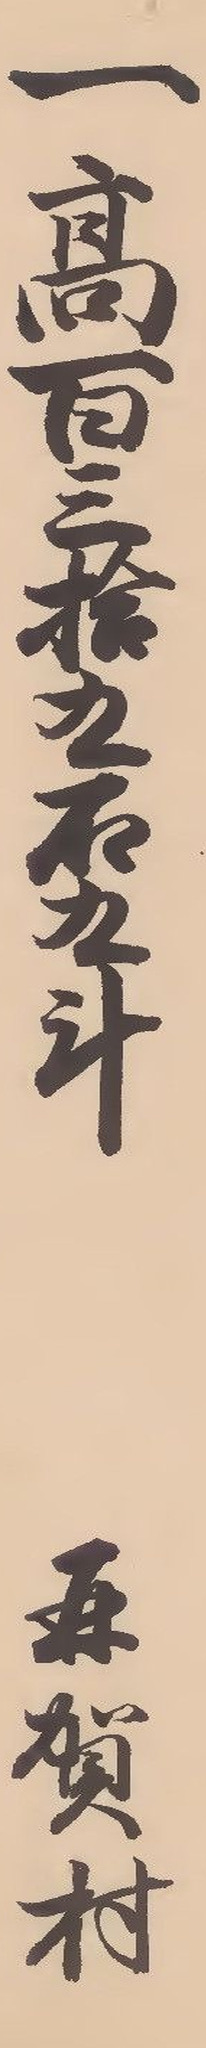一高百三拾九石九斗再賀村
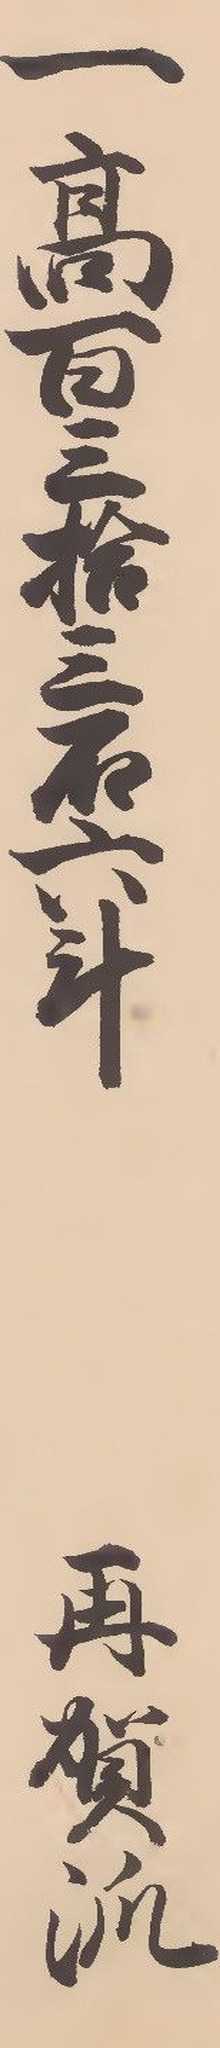一高百三拾三石六斗再賀派
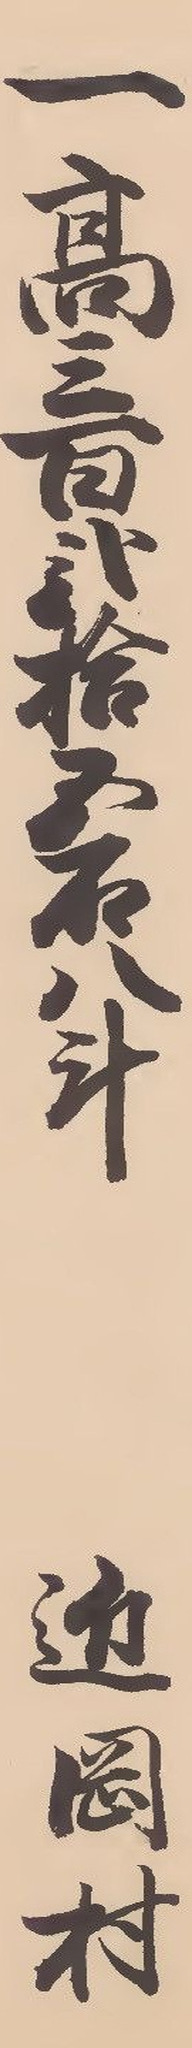一高三百弐拾五石八斗近岡村
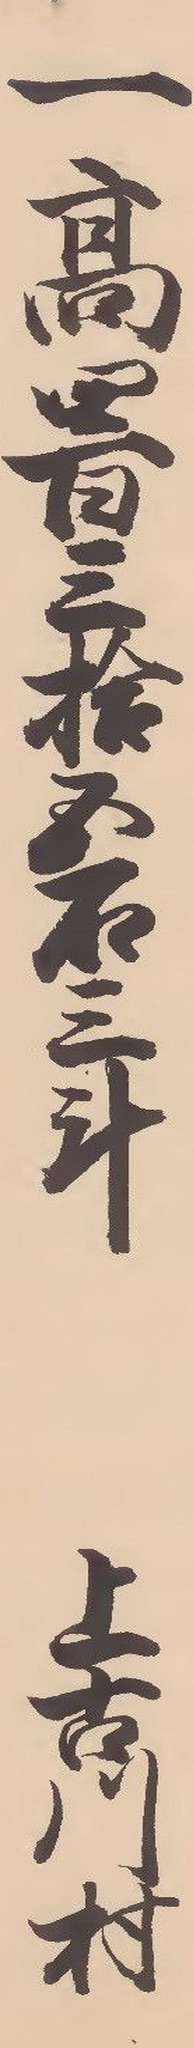一高四百三拾五石三斗上古川村
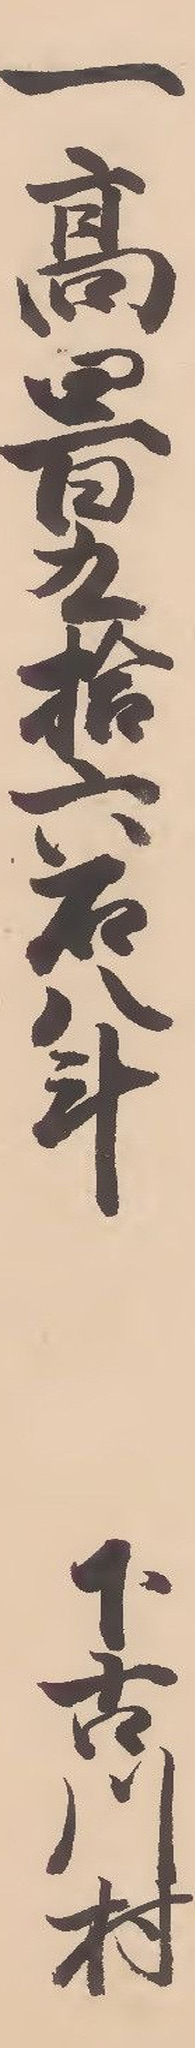一高四百九拾六石八斗下古川村

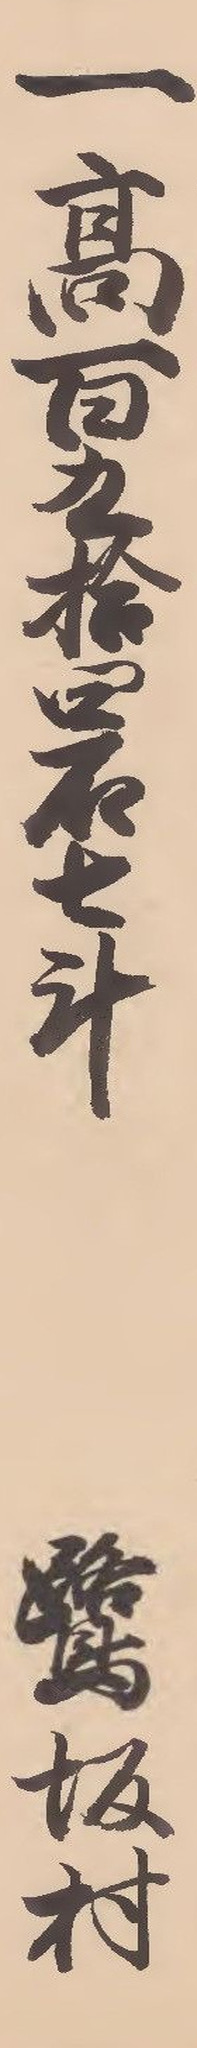一高百九拾四石七斗鷺坂村
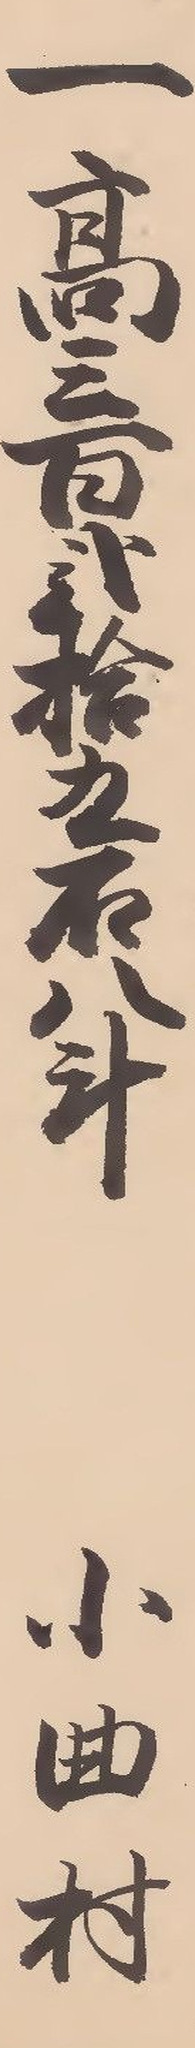一高三百弐拾九石八斗小曲村
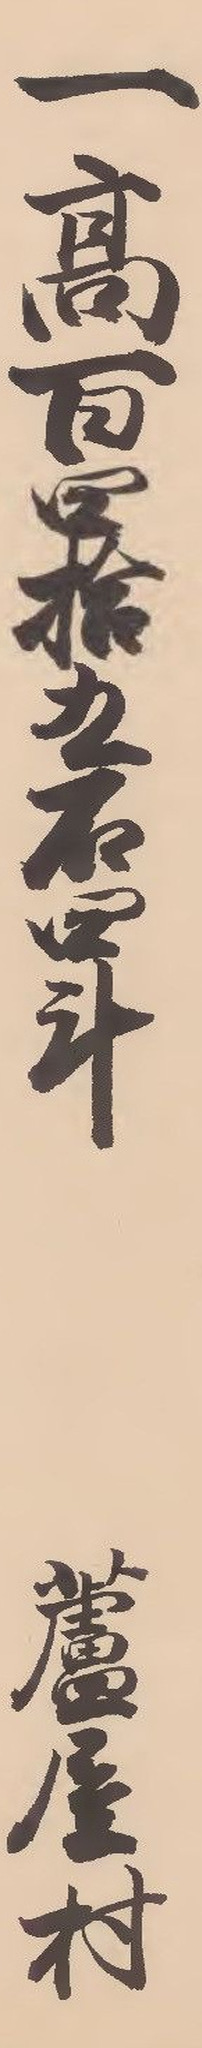一高百四拾九石四斗芦屋村
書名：陸奥国郷帳　７
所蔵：国立公文書館 National Archives of Japan
